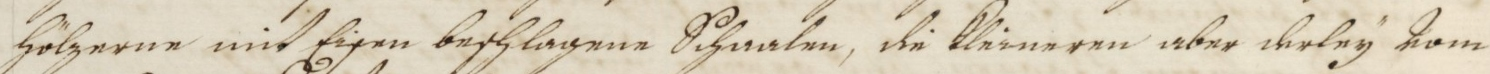hölzerne mit Eisen beschlagene Schaalen, die kleineren aber derley vom
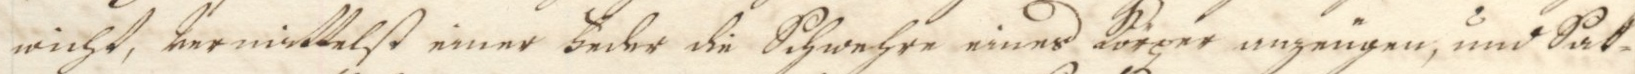wicht, vermittelst einer Feder die Schwehre eines Körper anzeügen, und Sak-
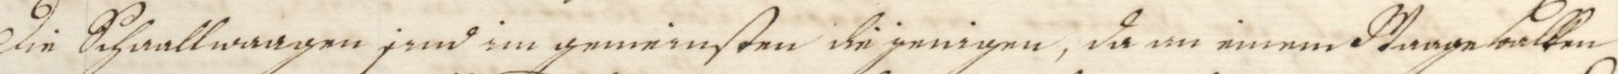Die Schaallwaagen sind im gemeinsten die jenigen, da an einem Waage Balken
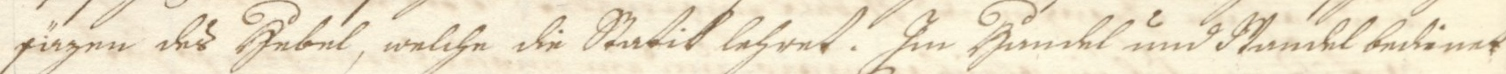säzen des Hebel, welche die Statik lehret. Im Handel und Wandel bedienet
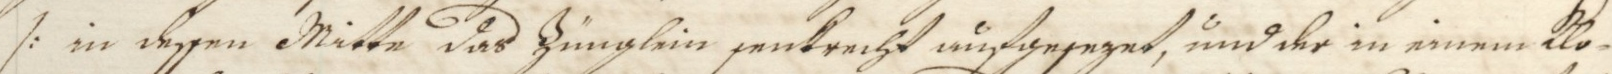(in dessen Mitte das Zünglein senkrecht aufgesezet, und der in einem Klo-
